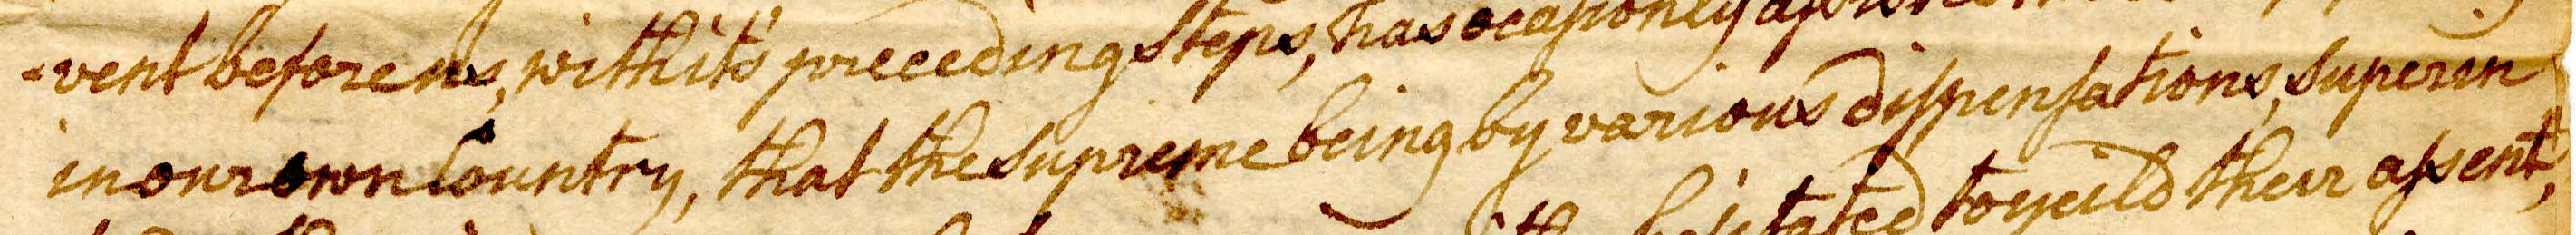in our own country, that the Supreme being by various dispensations, Superin
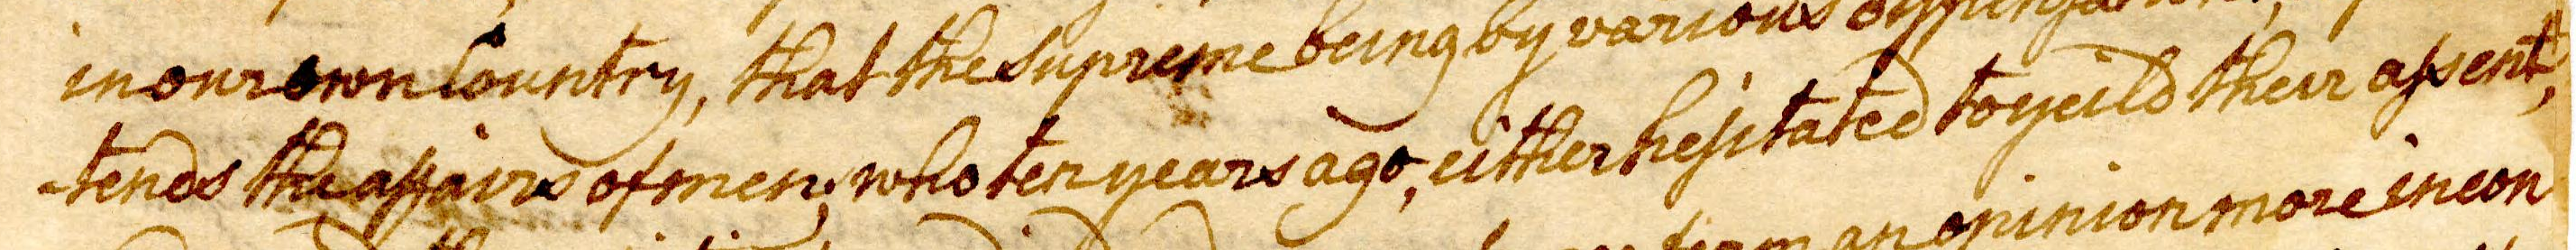-tends the affairs of men; who ten years ago, either hesitated to yeild their assent,
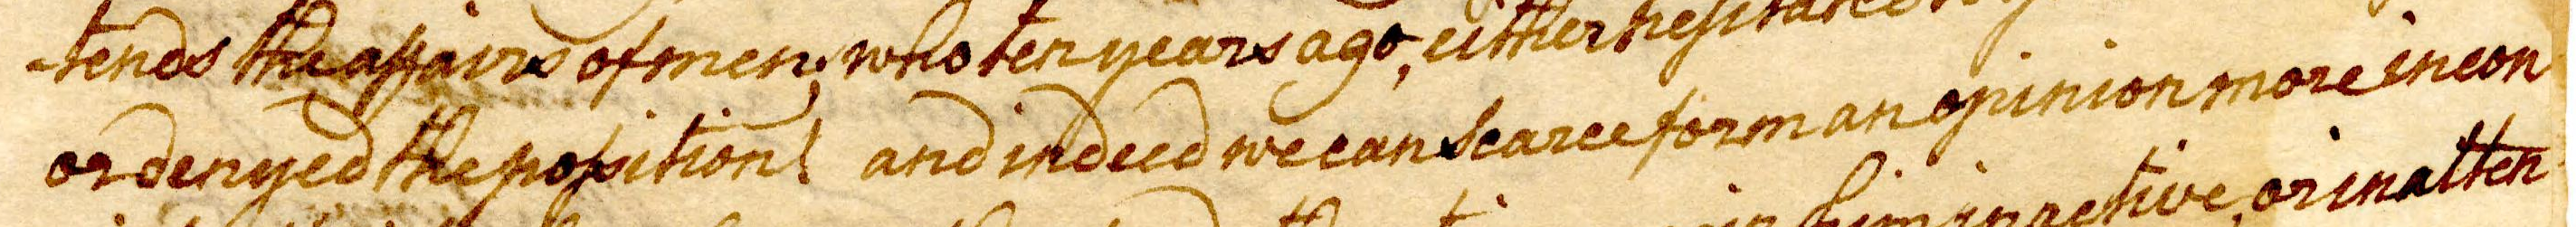or denyed the possition! and indeed we can scarce form an opinion more incon
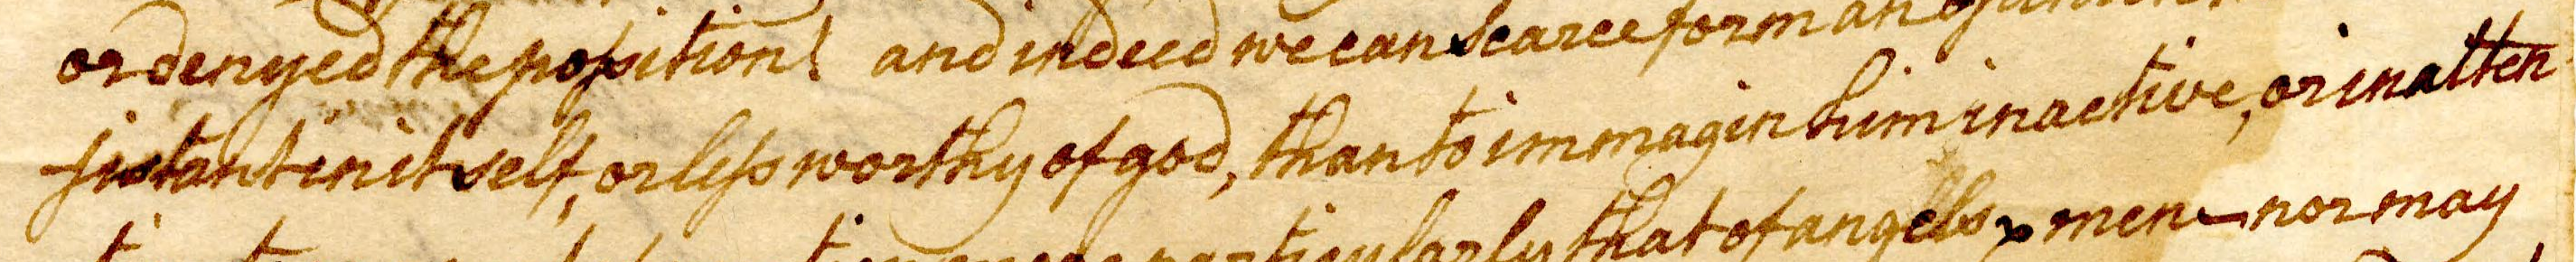-sistant in itself, or less worthy of god, than to immagin him inactive, or inatten
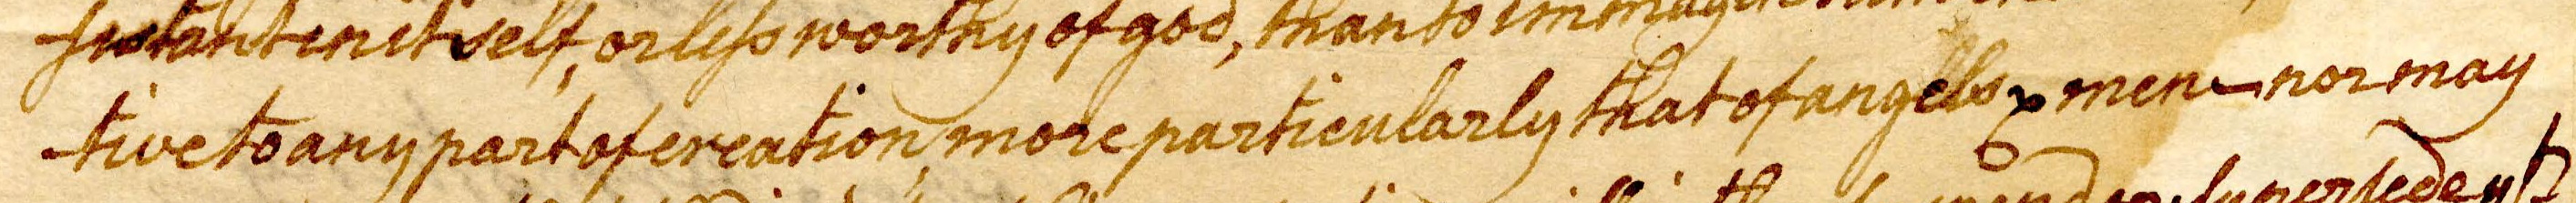-tive to any part of creation, more particularly that of angels & men- nor may
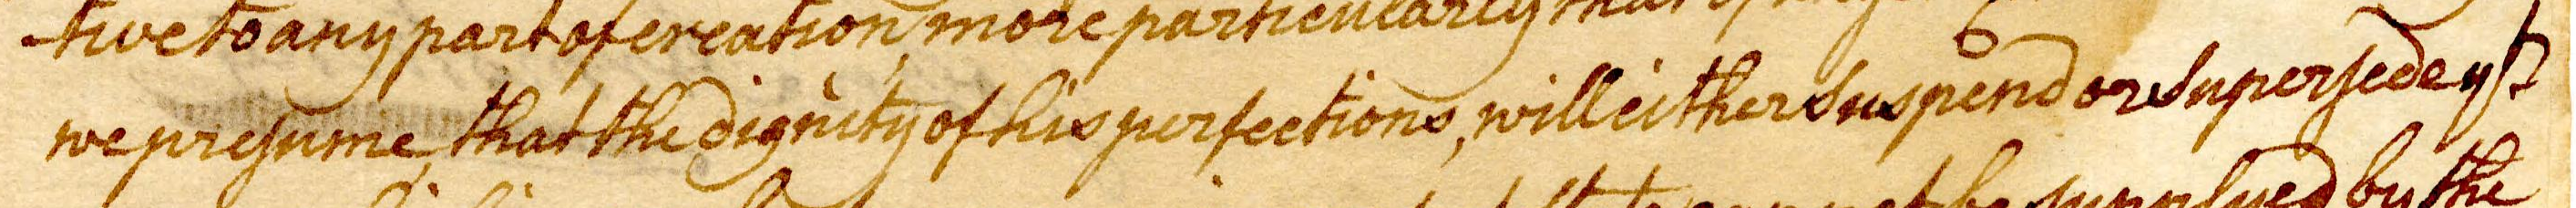we presume that the dignity of his perfections, will either suspend or supercede y^e.
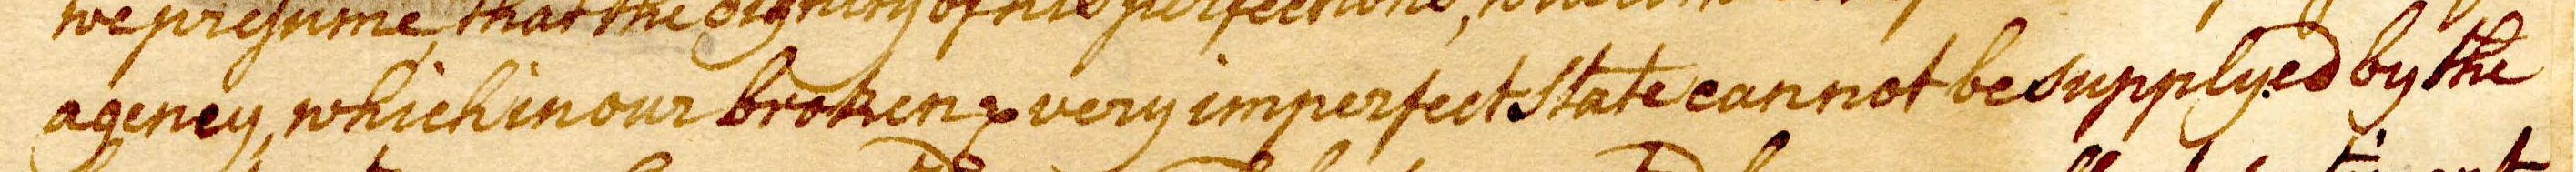agency, which in our broken & very imperfect state cannot be supplyed by the
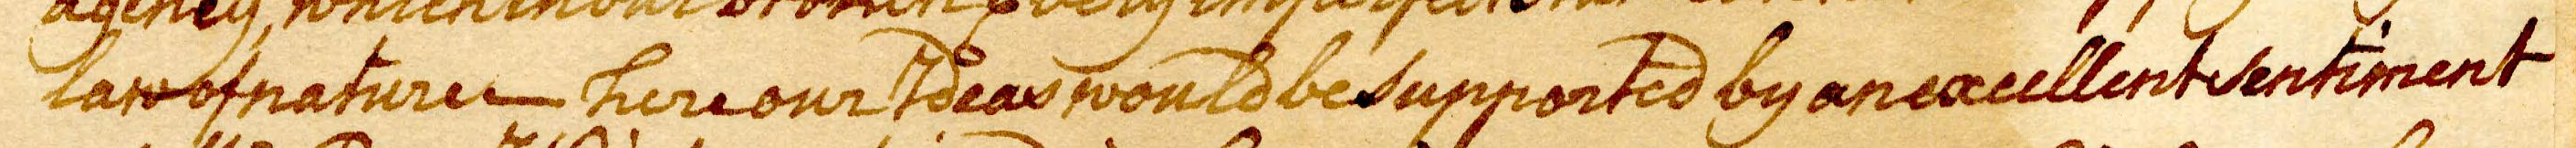law of nature- here our Seas would be supported by an excellent sentiment
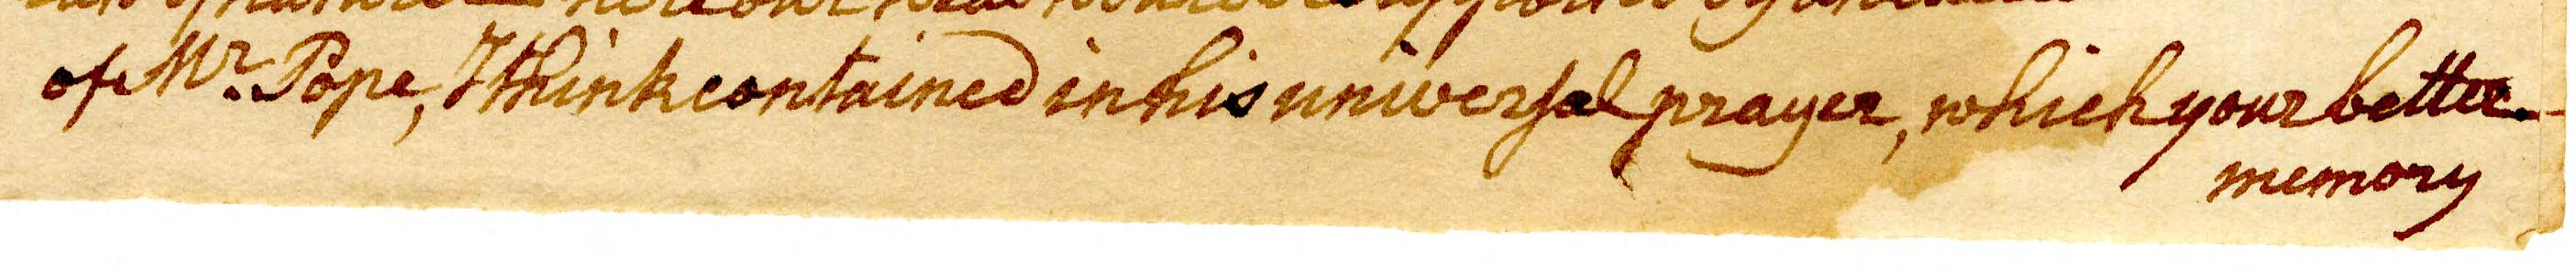of M^r Pope I think contained in his universal prayer, which your better
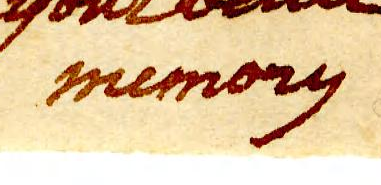memory
